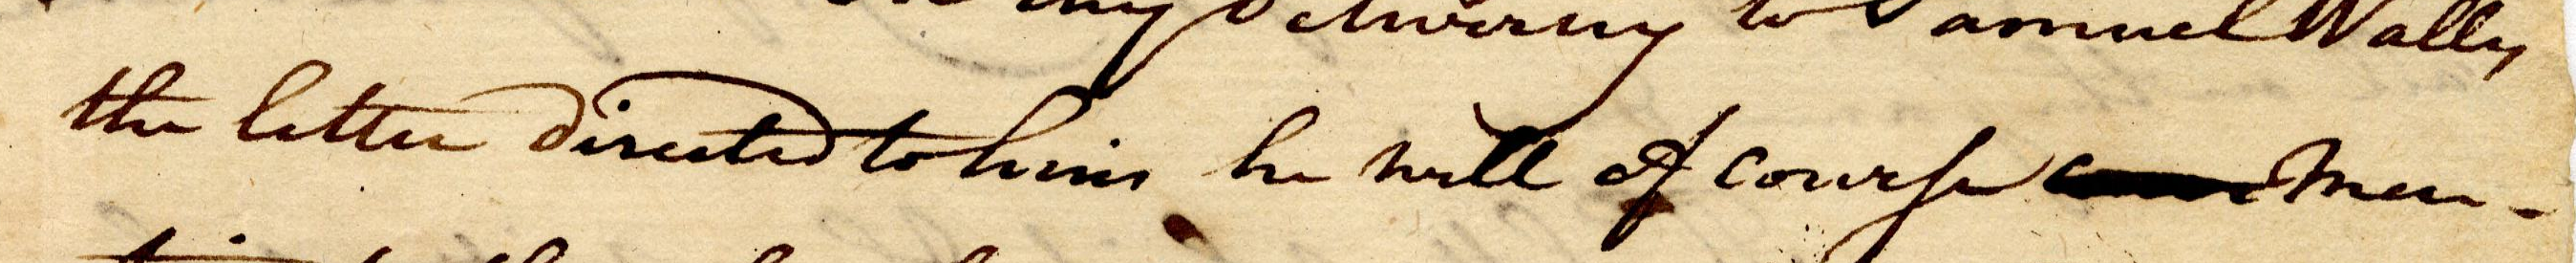the letter directed to him he will of course [___] men-
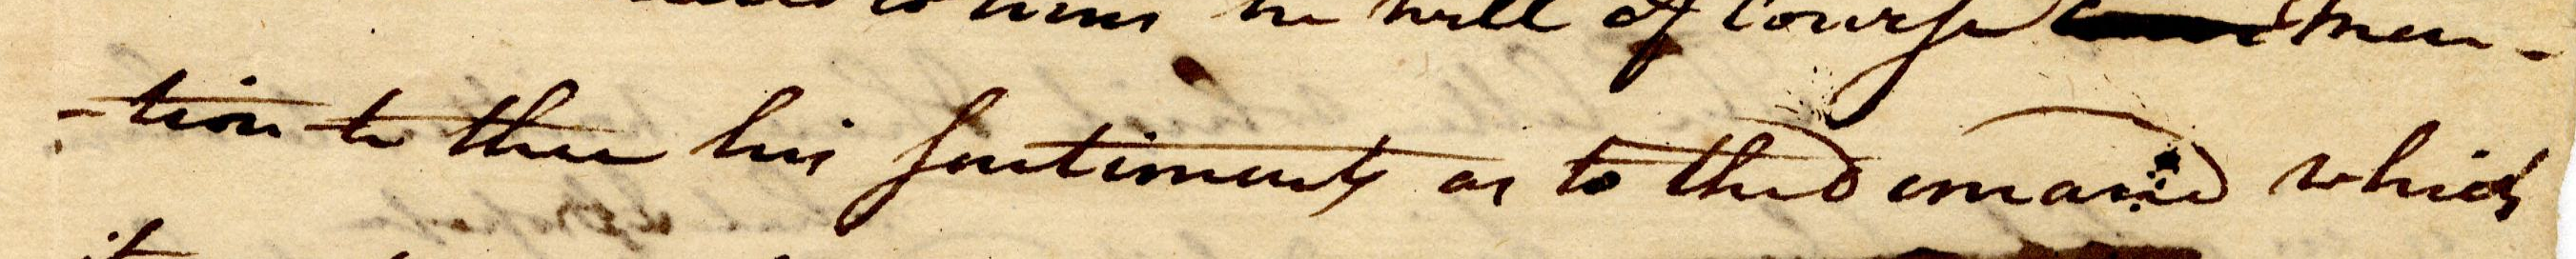-tion to thee his sentiments as to the demand which
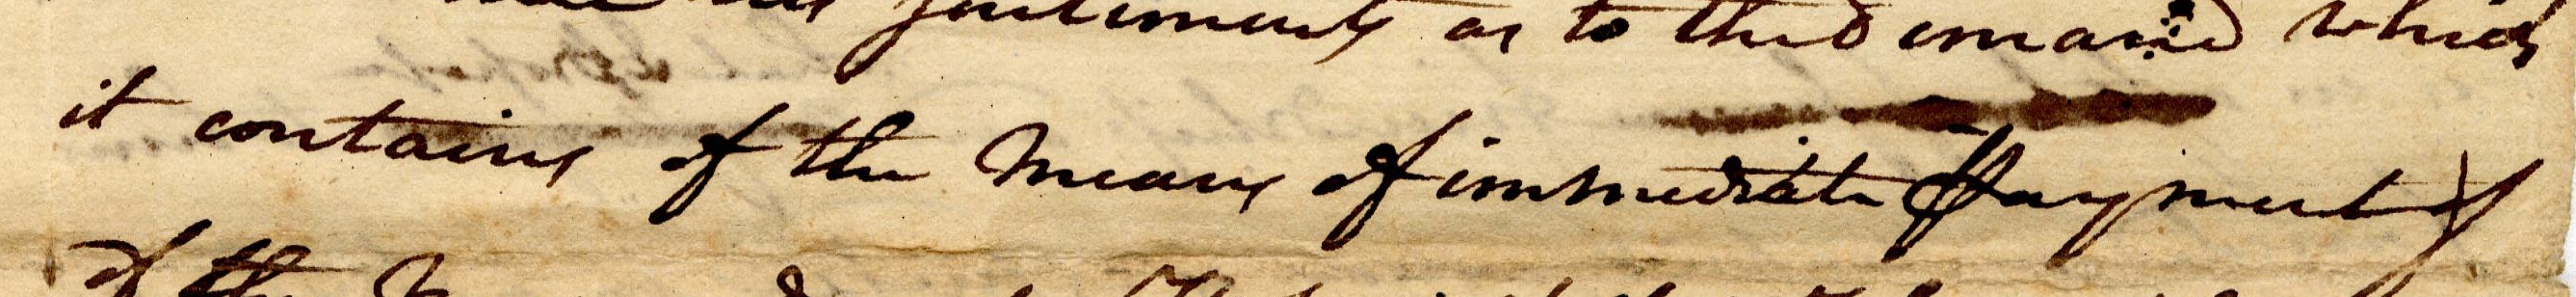it contains of the means of immediate pay must of
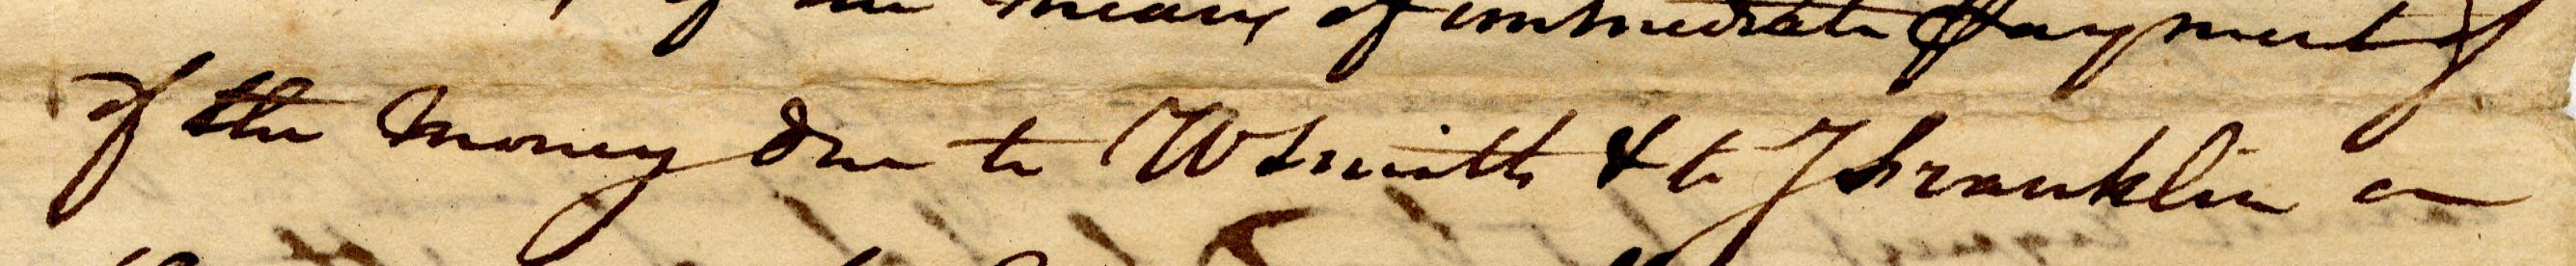of the money due to W Smith & to J Franklin on
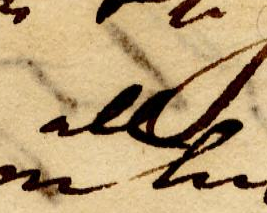all
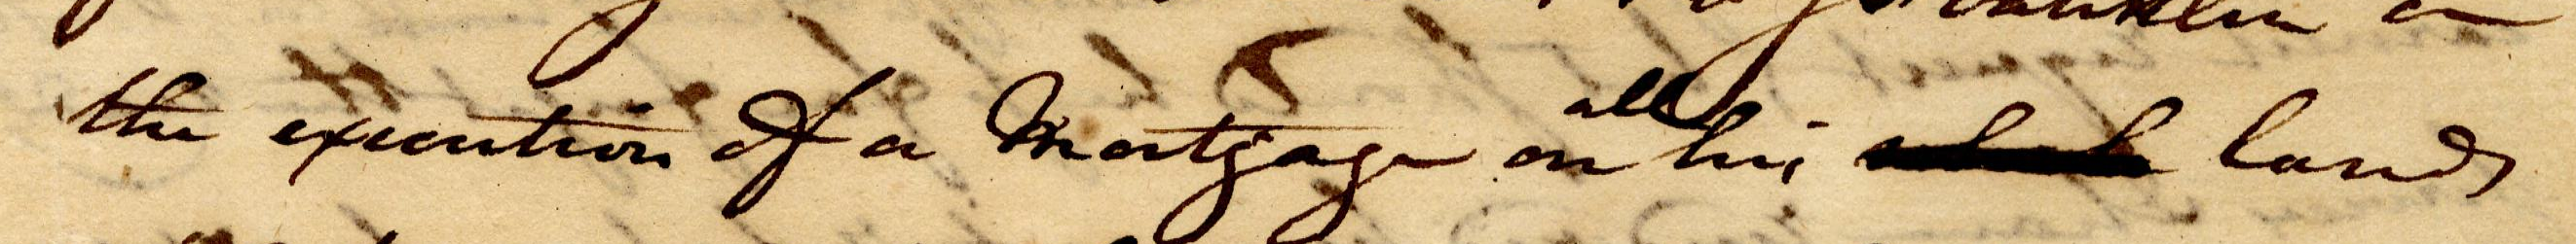the execution of a Mortgage on his [which] lands
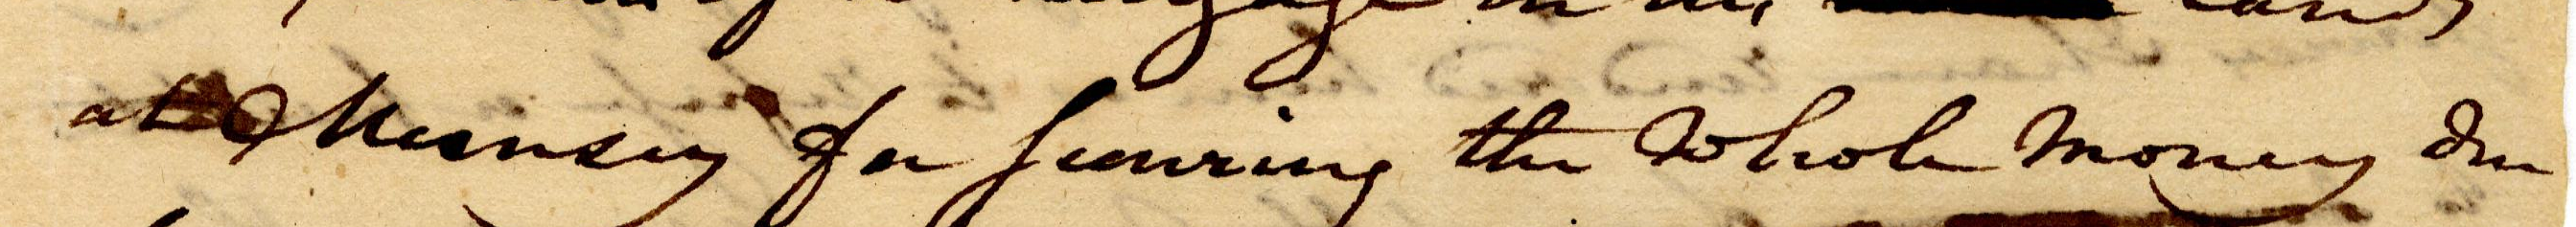at Money for scouring the whole money due
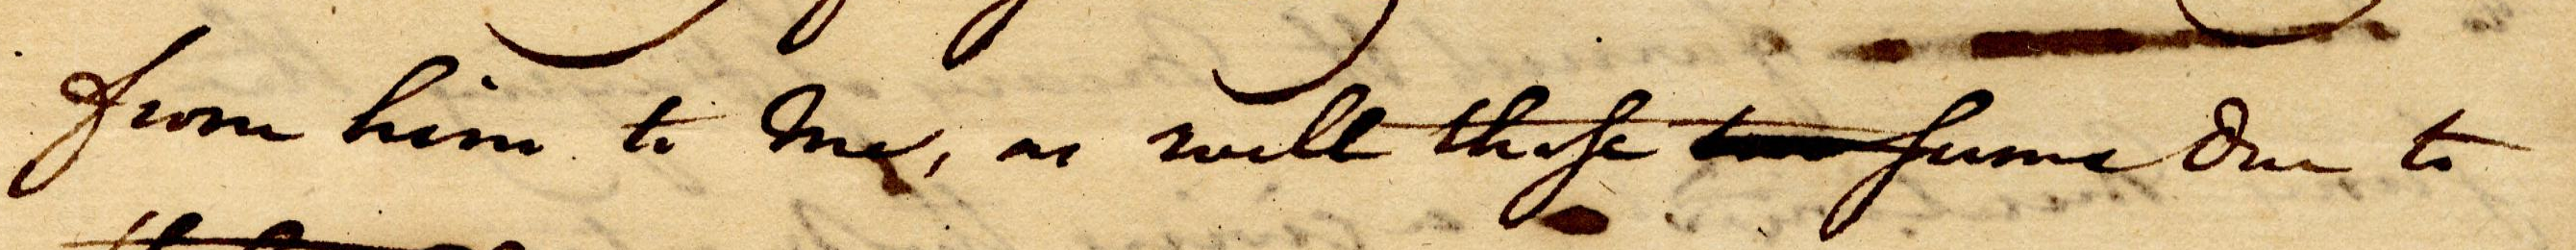from him to me as will these [___] sums due to
